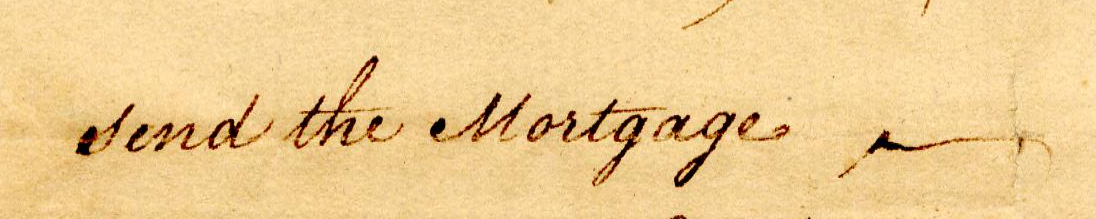send the Mortgage-
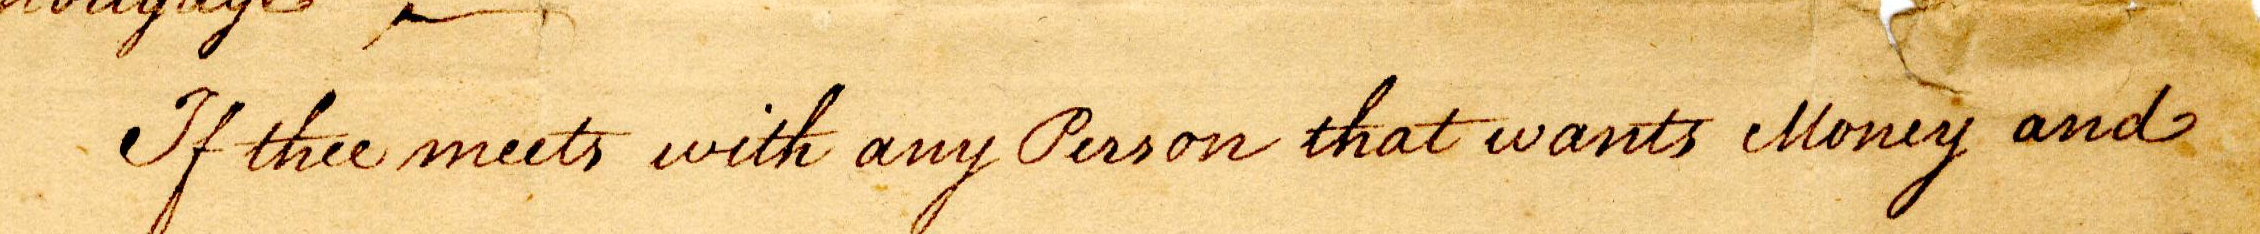If thee meets with any Person that wants Money and
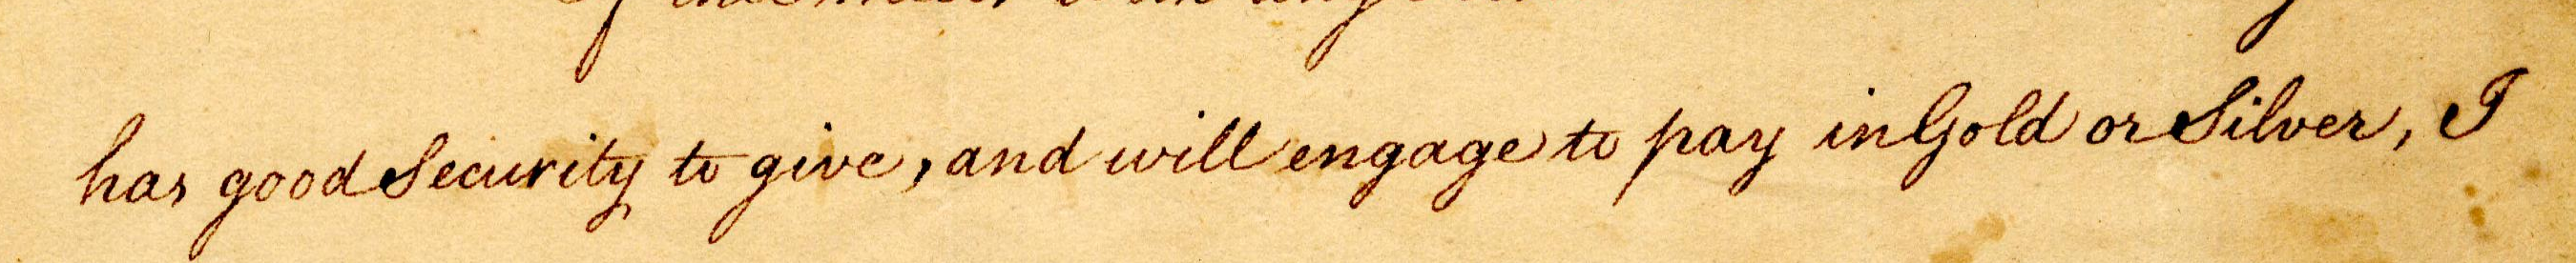has good Security to give, and will engage to pay in Gold or Silver, I
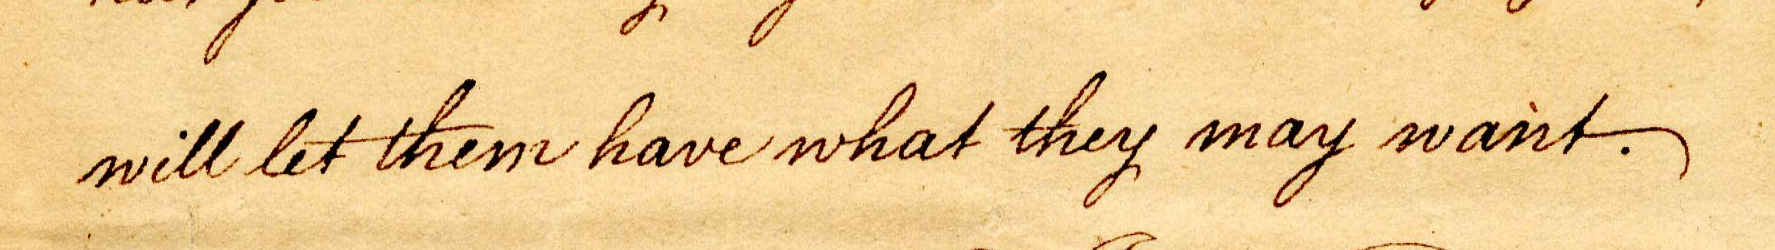will let them have what they may want.
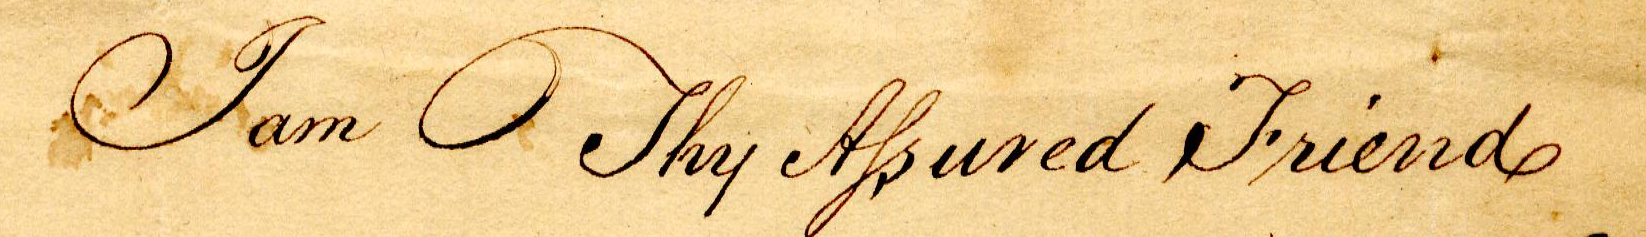I am Thy Assured Friend
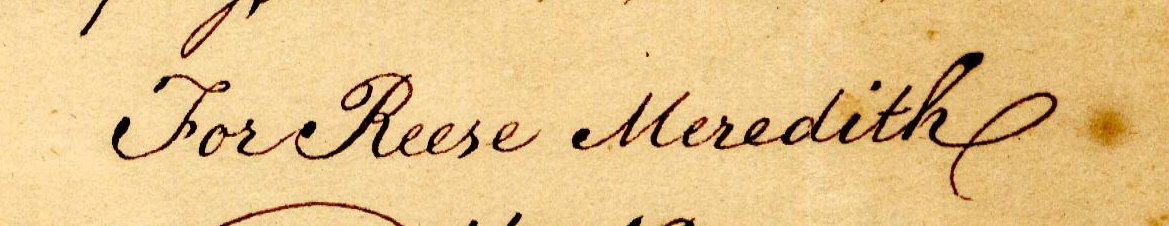For Reese Meredith
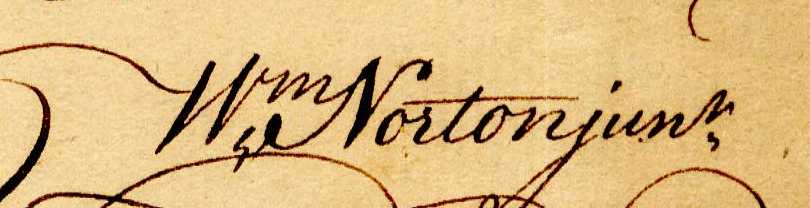W^m Norton jun^r.
